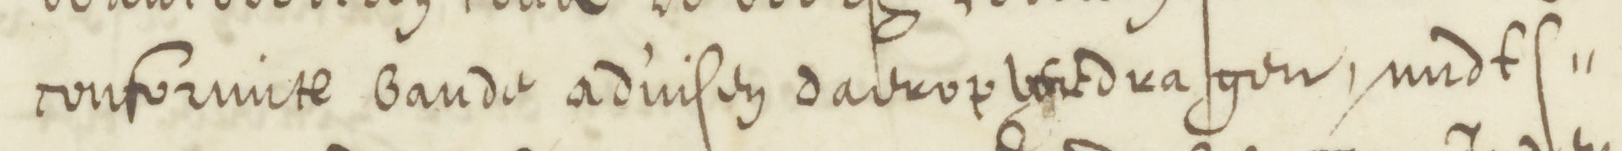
conformite vande aduisen daerop verdragen, midts„
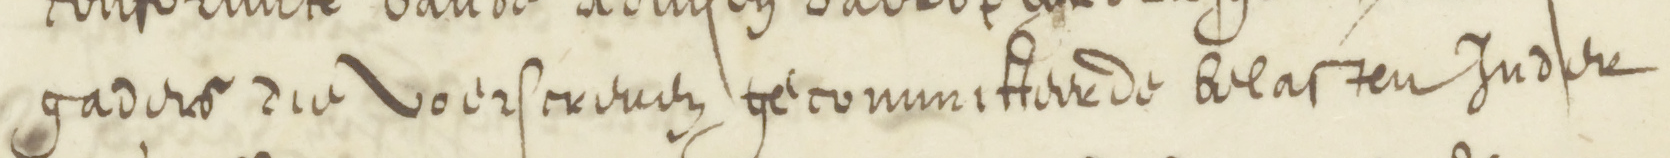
gaders die voerscreven gecommitteerde belasten In der
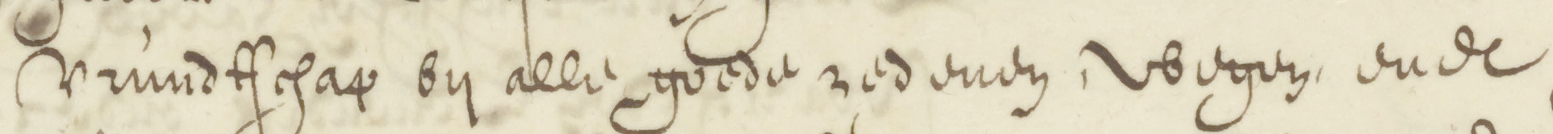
vrundtschap by alle goede redenen, wegen, ende
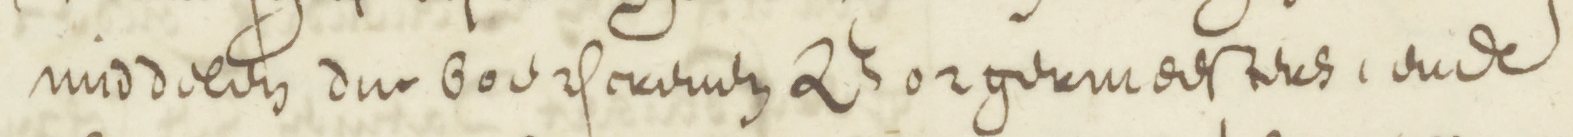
middelen die voerscreven Borgermeersters, ende
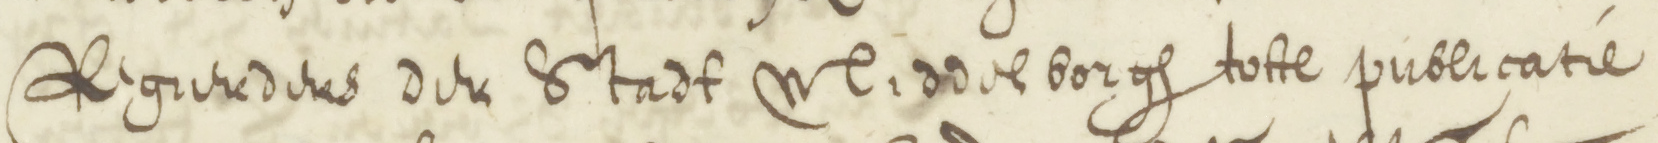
Regierders der Stadt Middelborgh totte publicatie
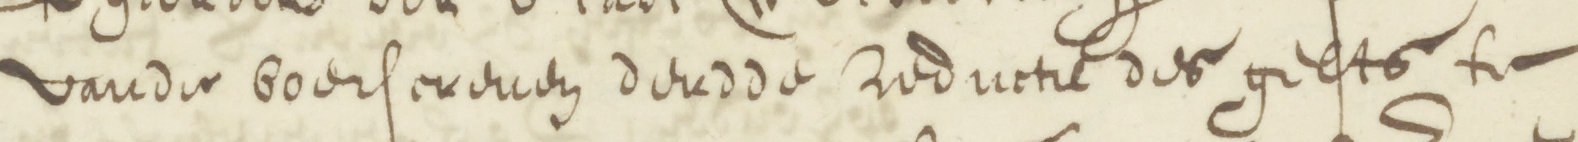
vande voerscreven derdde reductie des gelts te
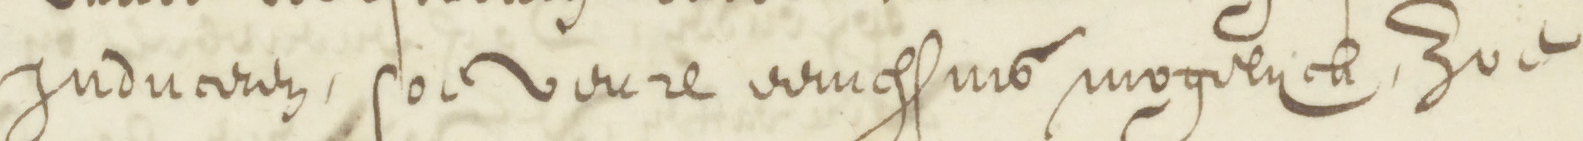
Induceren, soeverre eenichsins mogelyck, zoe
